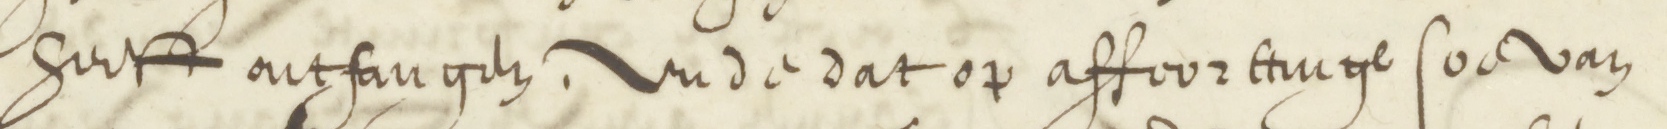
heeft ontfangen, ende dat op affcorttinge soe van
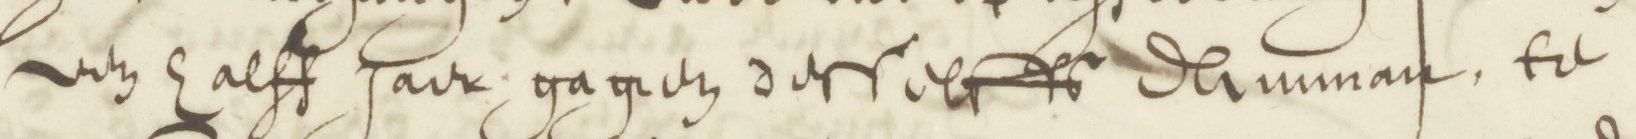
een halff Jaer gagien desselffs Damman, te
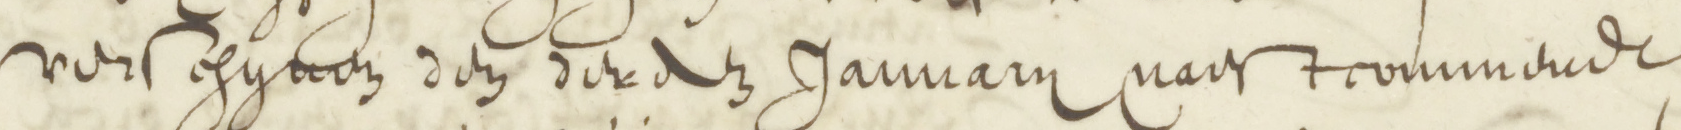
verschynen den derden January naestcommende
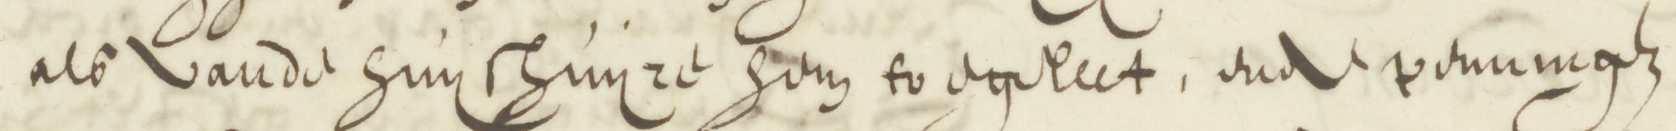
als vande huyshuyre hem toegeleet, ende penningen
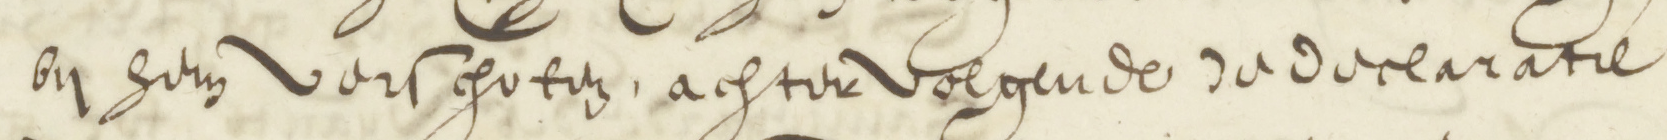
by hem verschoten, achtervolgende de declaratie
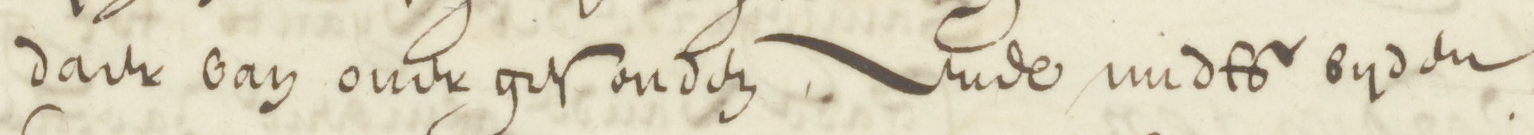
daer van ouergesonden, ende midts byden
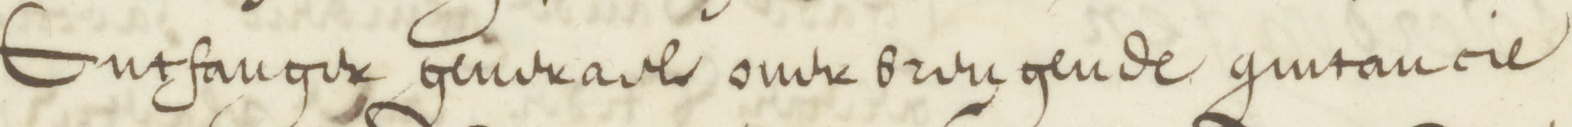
Ontfanger generael ouerbrengende quitancie
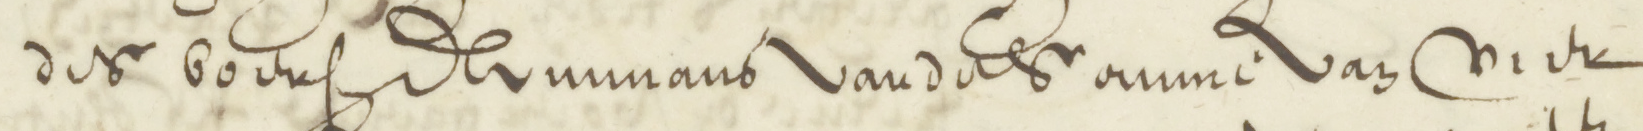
des voers Dammans vande Somme van vier
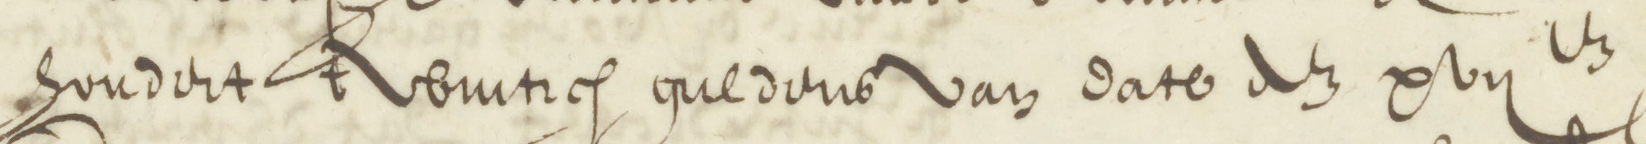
hondert twintich guldens van date den xvijen
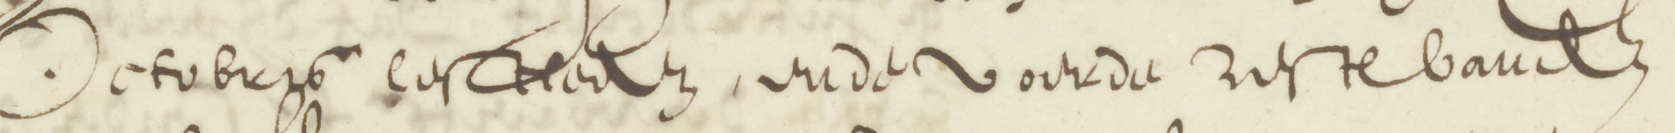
Octobris lesttleden, ende voerde reste vanden
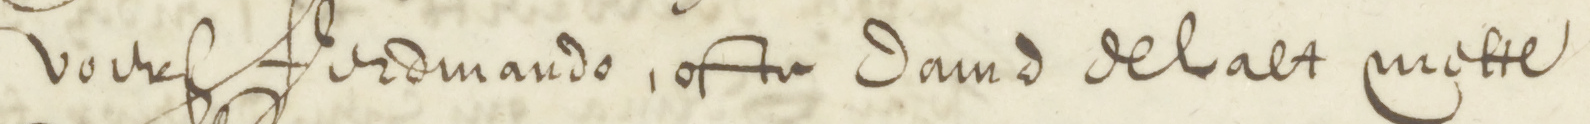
voers Ferdinando, ofte dauid de laet mette
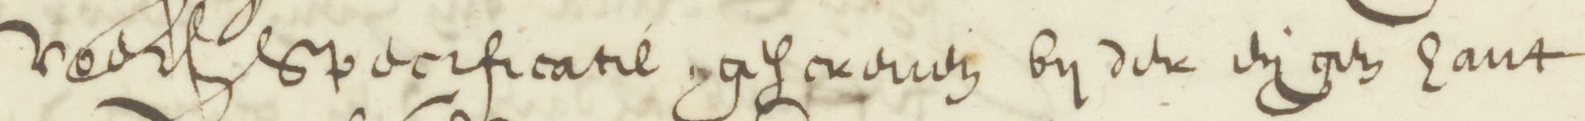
voers specificatie, gescreuen by der eygen hant
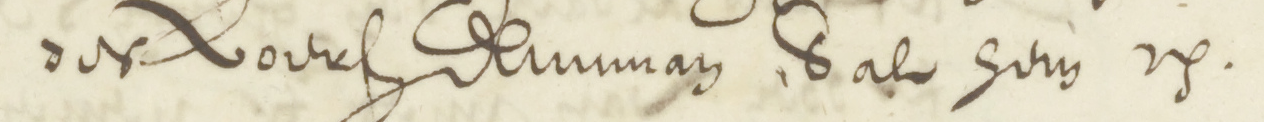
des voers Damman, Sal hem rs.
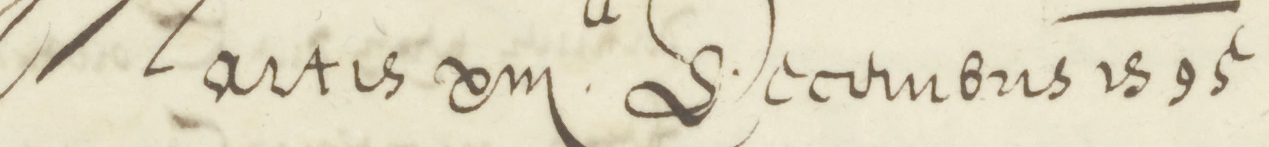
Martis xiii.a Decembris 1335
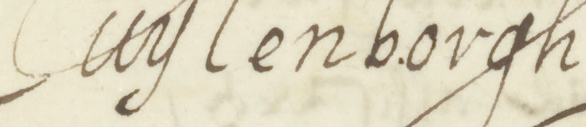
Cuylenborgh
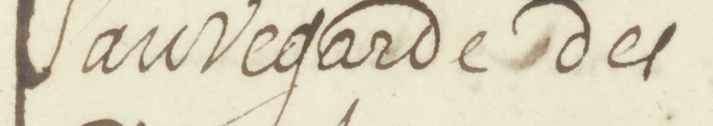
Sauvegarde des
